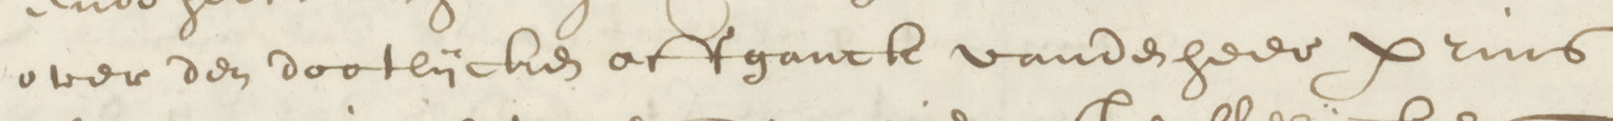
over den dootlijcken affganck vanden heer Prins
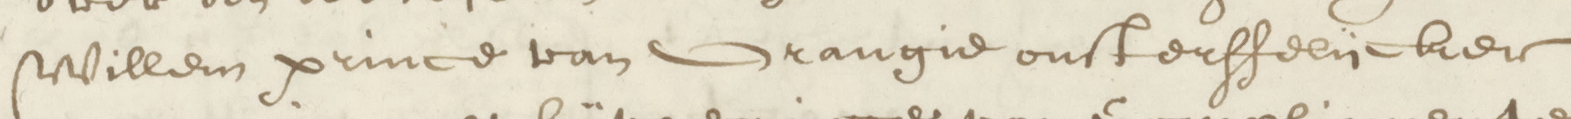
Willem prince van Orangie onsterffelijcker
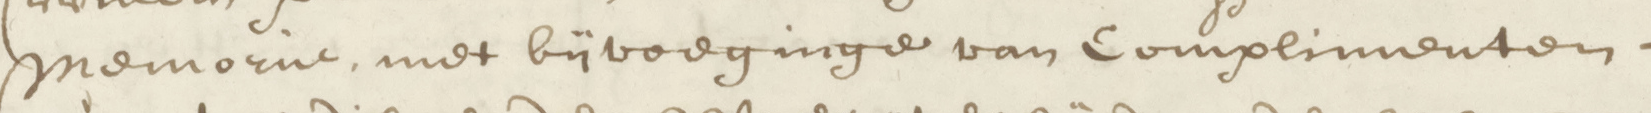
Memorie, met bijvoeginge van Complimenten
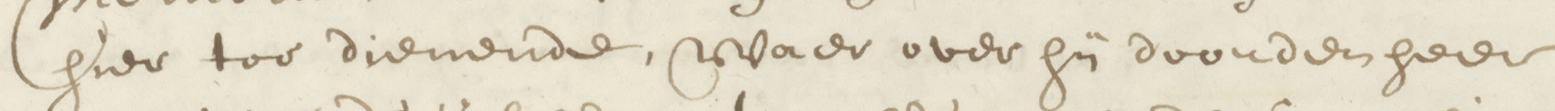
hier toe dienende. Waer over hij door den heer
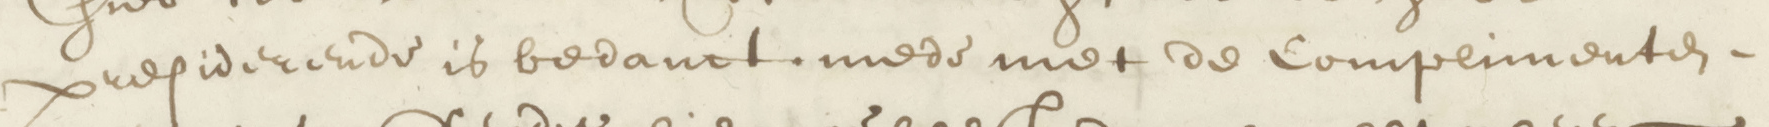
presiderende is bedanct mede met de Complimenten
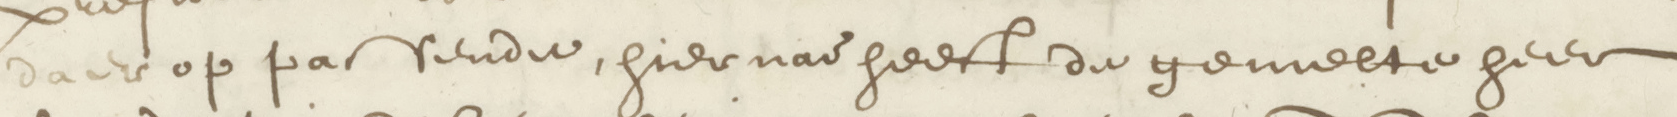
daer op passende, hier nae heeft de gemelte heer
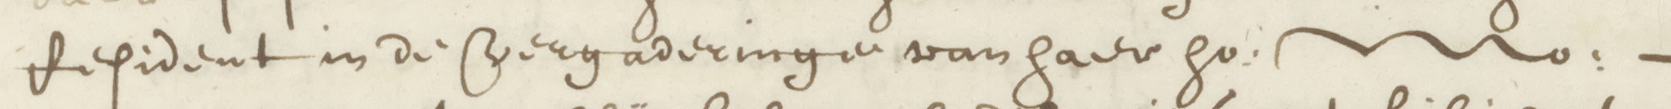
Resident in de Vergaderinge van haer ho:Mo:
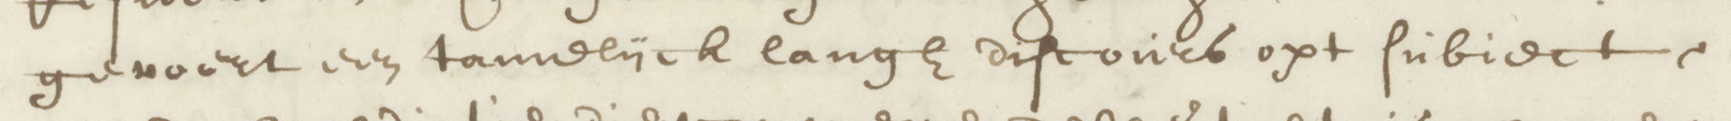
gevoert een tamelijck langh discours opt subiect
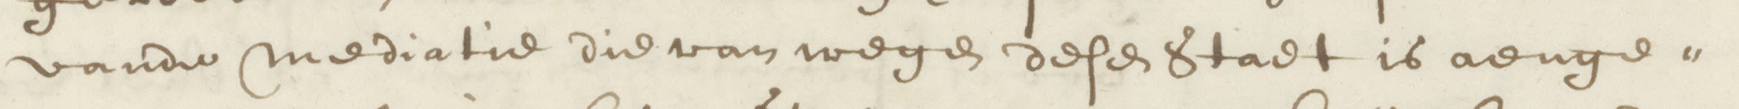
vande mediatie die van wegen desen Staet is aenge„
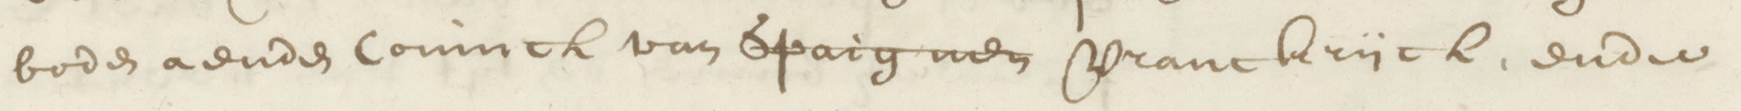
boden aenden Coninck van Spaignen Vranckrijck, ende
